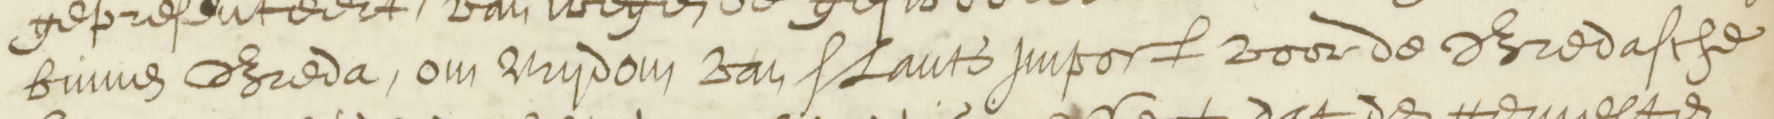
binnen Breda, om vrydom van sLants impost voor de Bredasche
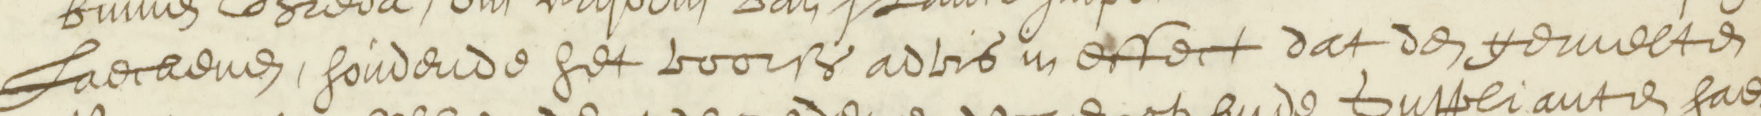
Laeckenen, houdende het voors advis in effect dat den gemelten
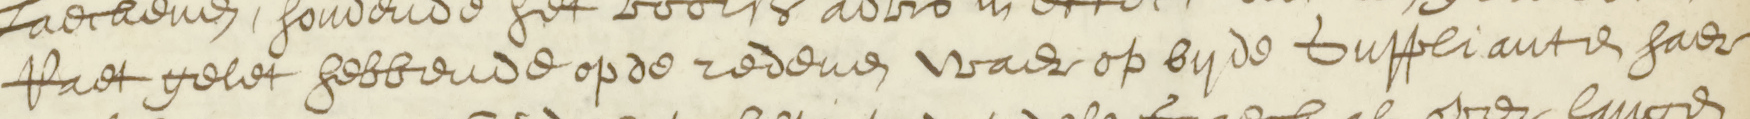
Raet gelet hebbende opde redenen waer op byde Supplianten haer
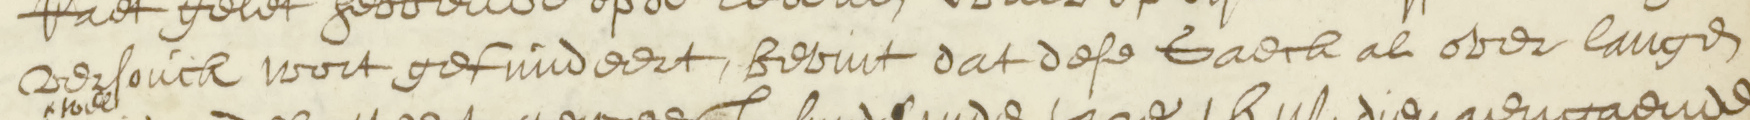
versouck wort gefundeert, bevint dat dese Saeck al over langen
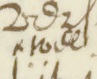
^wel
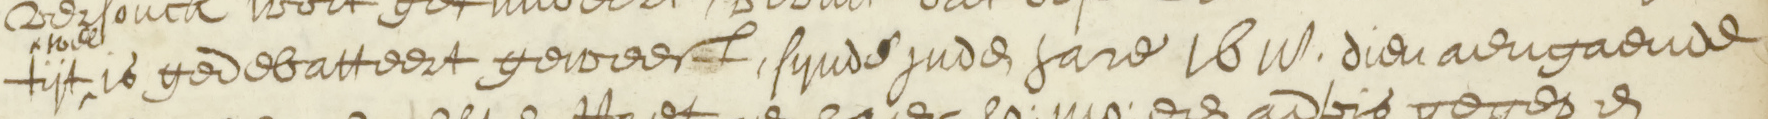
tijt^is gedebatteert geweest, synde inden jare 1618. dien aengaende
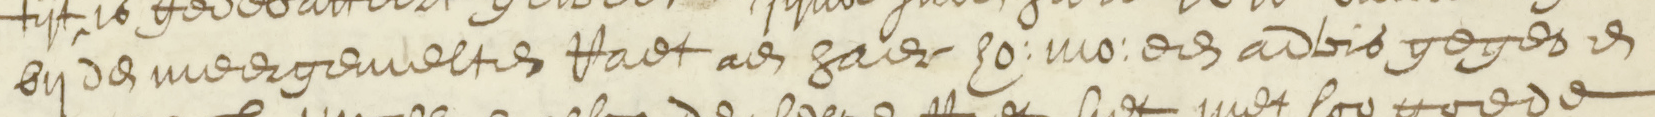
by den meergemelten Raet aen haer ho:mo een advis gegeven
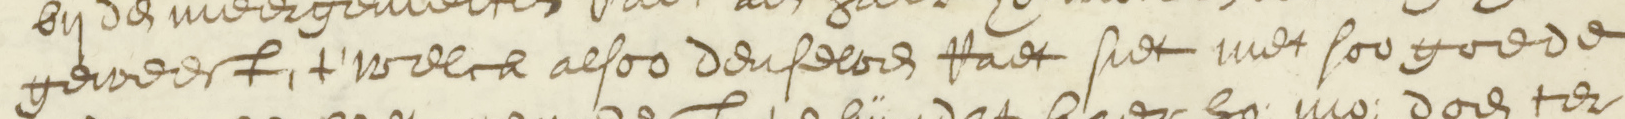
geweest, t'welck alsoo denselven Raet siet met soo goede
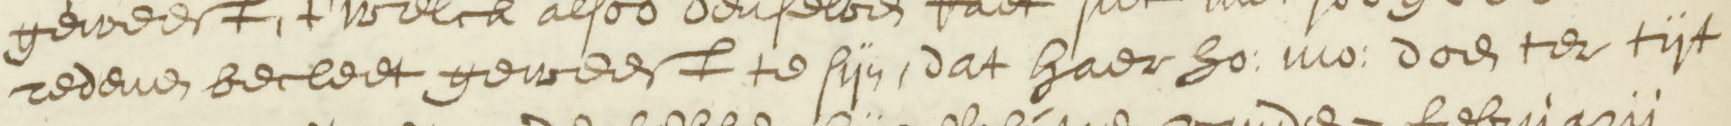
redenen becleet geweest te sijn, dat haer ho:mo: doen ter tijt
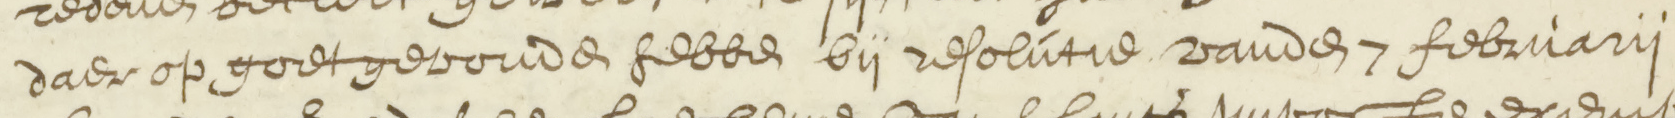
daer op goetgevonden hebben bij resolutie vanden 7 februarij
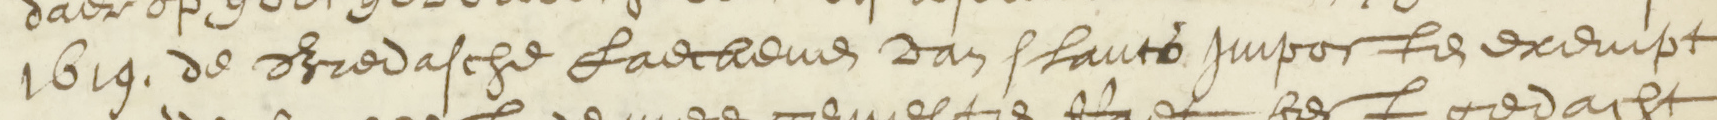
1619. de Bredasche Laeckenen van sLants Imposten exempt
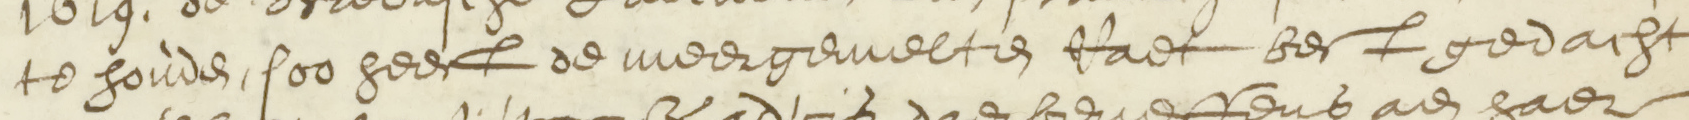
te houden, soo heeft de meergemelten Raet best gedacht
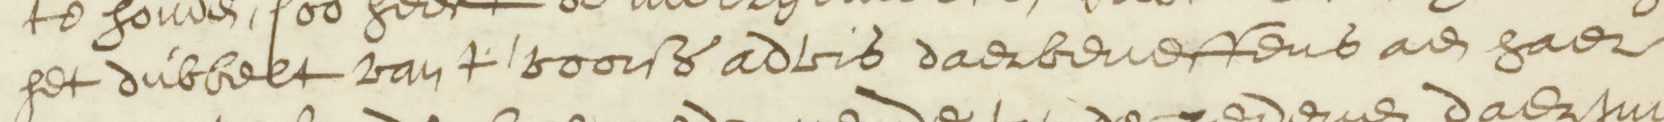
het dubbelt van t'voors advis daerbeneffens aen haer
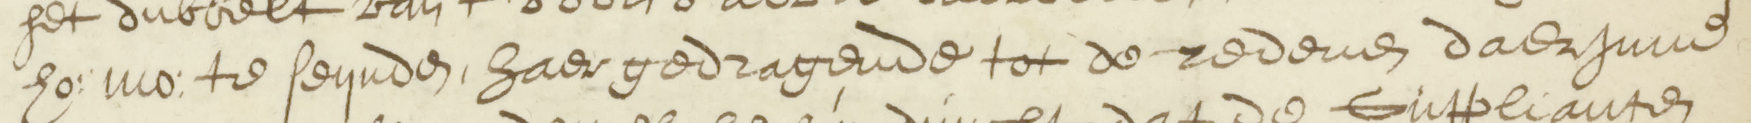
ho:mo: te seynden, haer gedragende tot de redenen daerinne
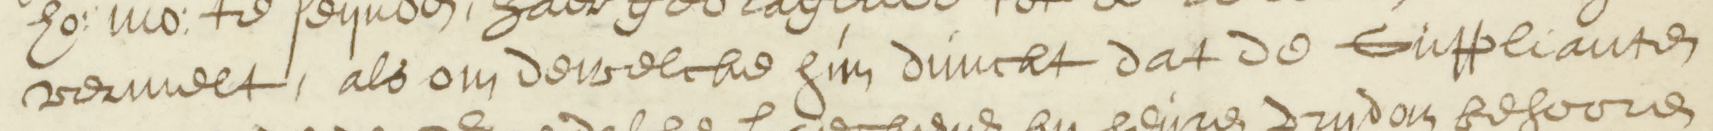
vermelt, als om dewelcke hun dunckt dat de Supplianten
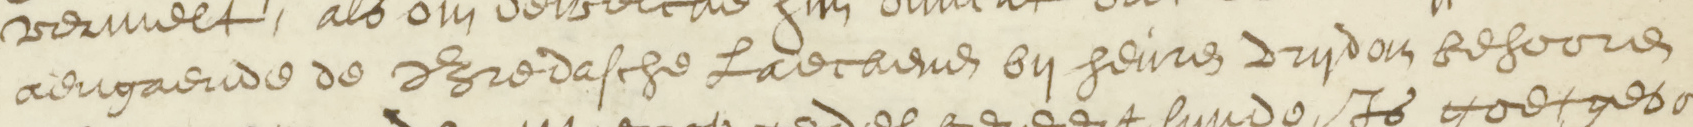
aengaende de Bredasche Laeckenen by heuren vrydom behooren
